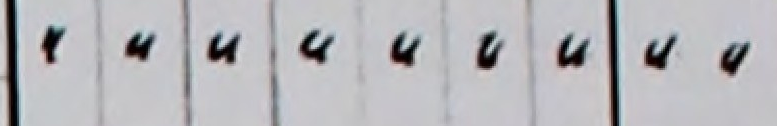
„„„„„„„„„
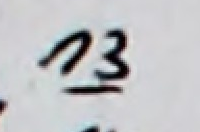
13
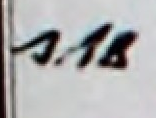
s. 18
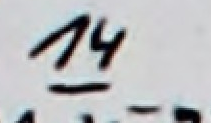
14
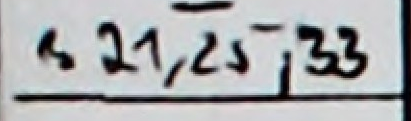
s 21, 25, 33
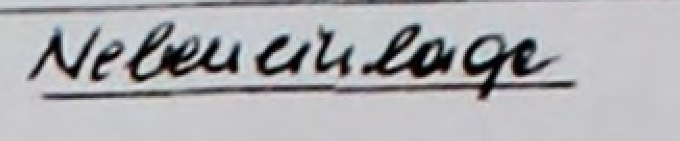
Nebeueinlage
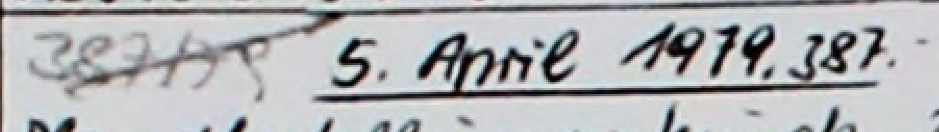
387/79 5. April 1979, 387.-
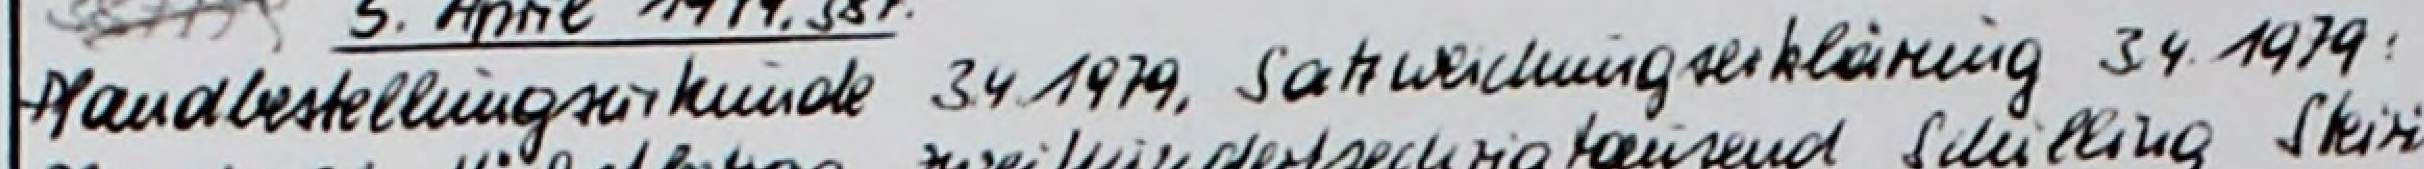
Pfandbestellungsurkunde 3.4.1979, Satzweichungserklärung 3.4.1979:
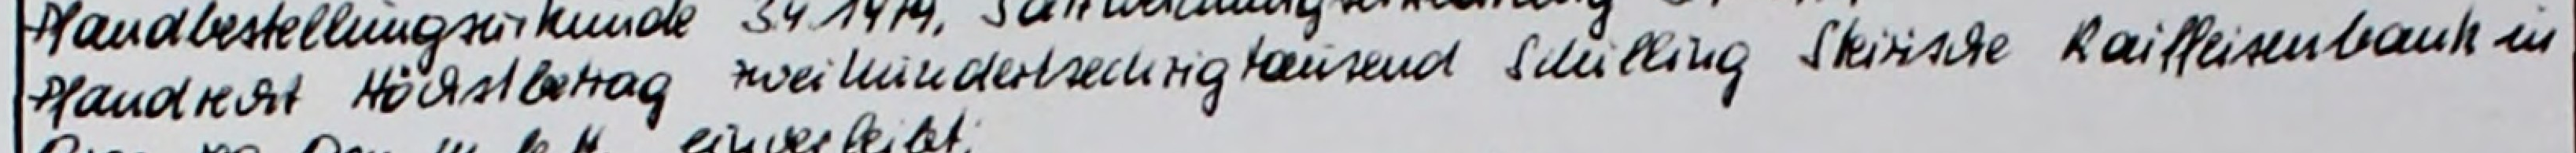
Pfandrecht Höchstbetrag zwei hundertsechzig tausend Schilling Skizische Raiffeisenbank in
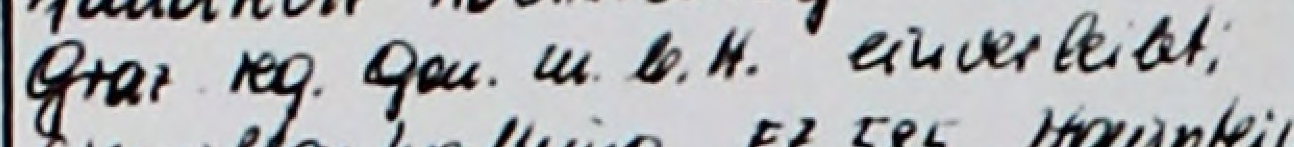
Graz. reg. Gen. m. C. H. einverleibt;
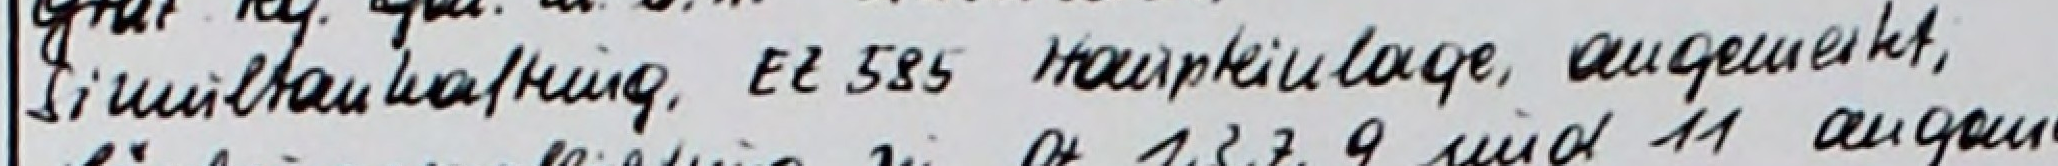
Simultanhaftung, EZ 585 Haupteinlage, angemerkt,
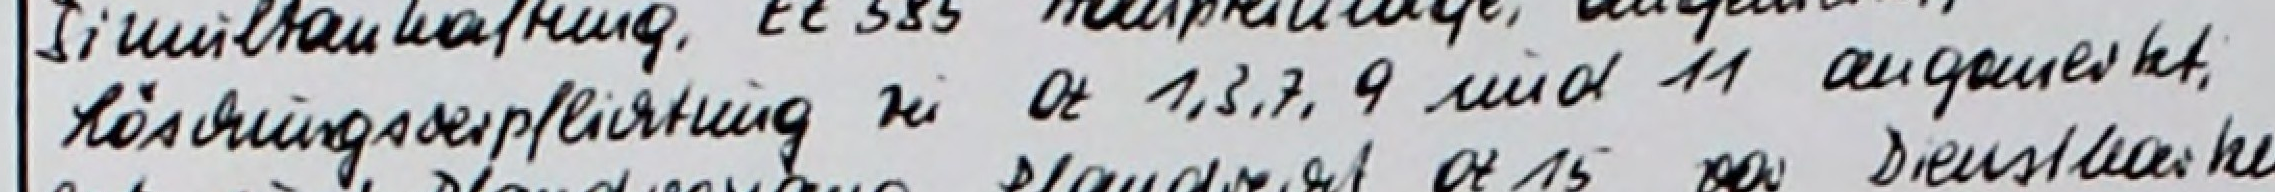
Löschungsverpflichtung zu OZ 1, 3, 7, 9 und 11 angemerkt;
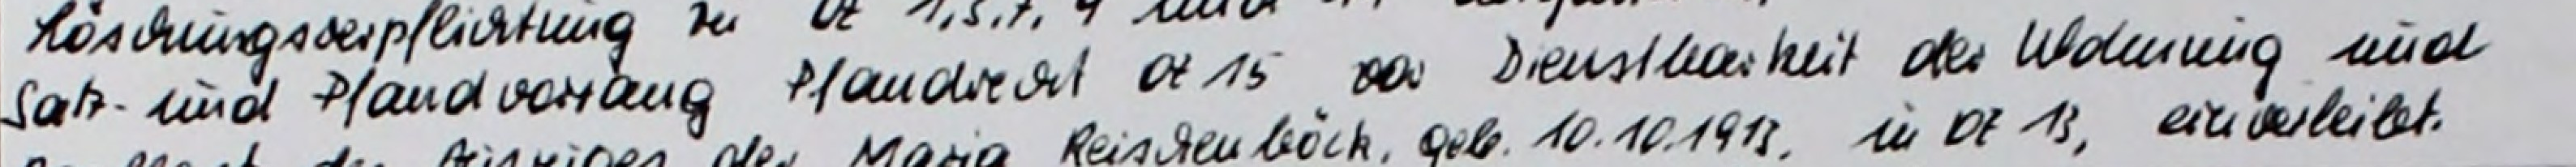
Satz- und Pfandverrang Pfandrecht OZ 15 vor Dienstbarkeit der Wohnung und
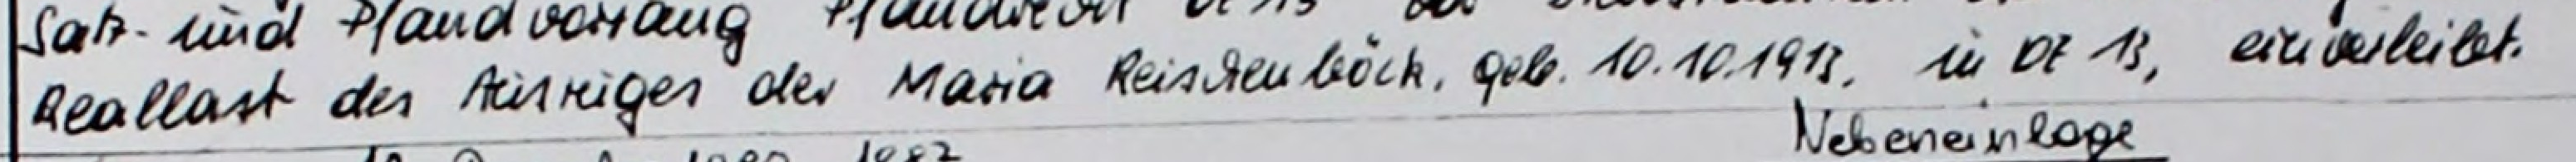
Reallast des Austeiges der Maria Reischenböck, geb. 10.10.1913, in OZ 13, einverleibt.
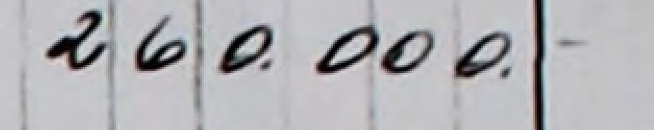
260.000.
